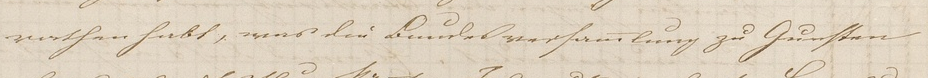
rathen habt, was die Bundesversammlung zu Gunsten
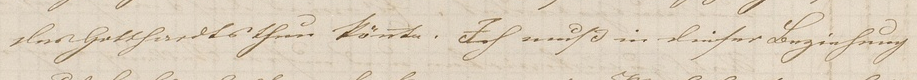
des Gotthardts thun könnte. Ich muß in dieser Beziehung
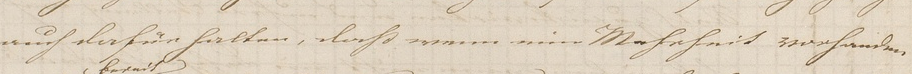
auch dafür halten, daß wenn eine Mehrheit vorhanden
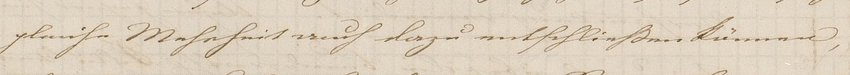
gleiche Mehrheit auch dazu entschließen können,
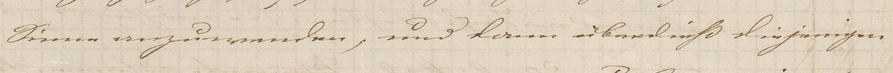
Sinne anzuwenden, und dann überdieß diejenigen
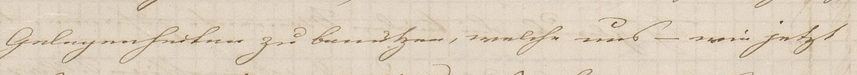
Gelegenheiten zu benutzen, welche uns – wie jetzt
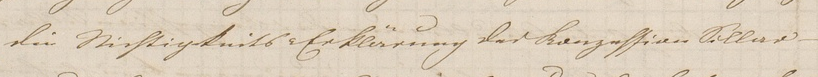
die Nichtigkeits-Erklärung der Konzession Sillar –
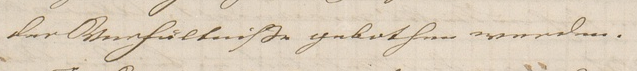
der Verhältniße gebothen werden.
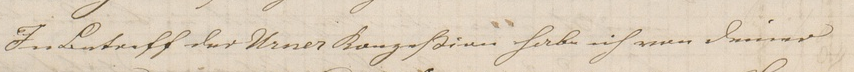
In Betreff der Urner Konzeßion habe ich von Deiner
